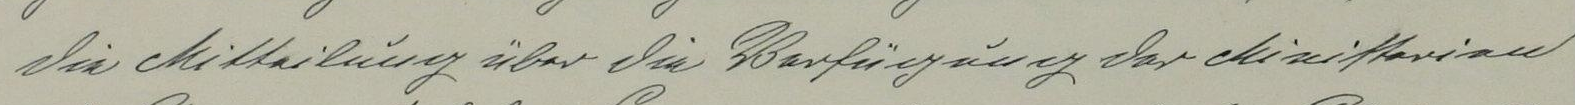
die Mitteilung über die Verfügung der Ministerien
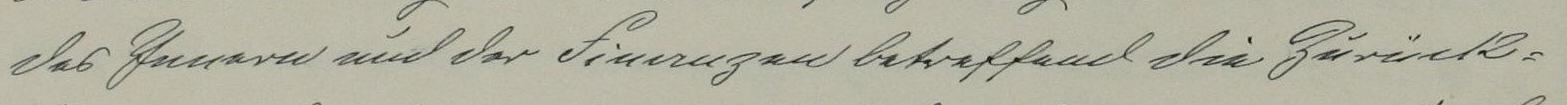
des Innern und der Finanzen betreffend die Zurück-
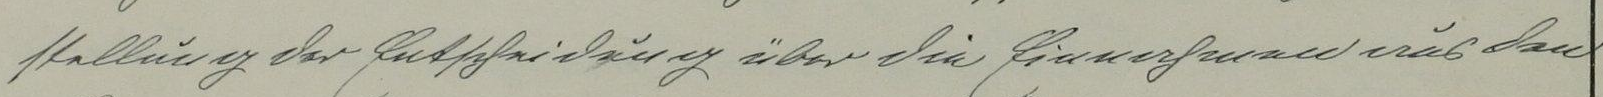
stellung der Entscheidung über die Einnahmen aus den
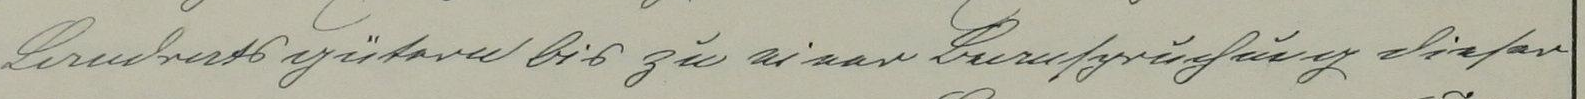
Landratsgütern bis zu einer Beanspruchung dieser
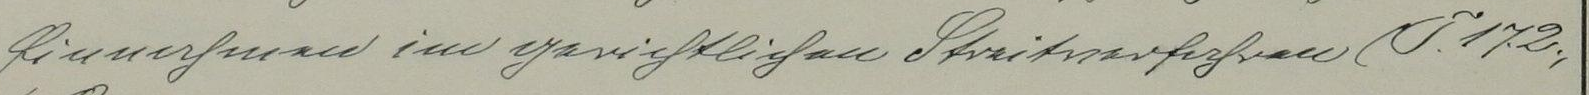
Einnahmen im gerichtlichen Streitverfahren (T.172;
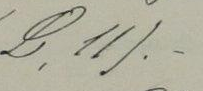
L.11).
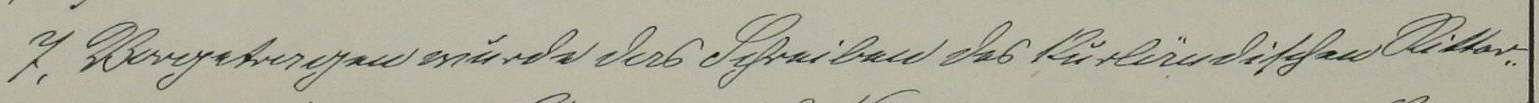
7. Vorgetragen wurde das Schreiben des kurländischen Ritter-
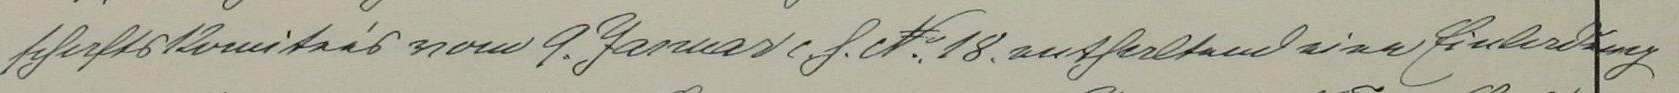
schaftskomitees vom 9. Januar c. s. No. 18, enthaltend eine Einladung
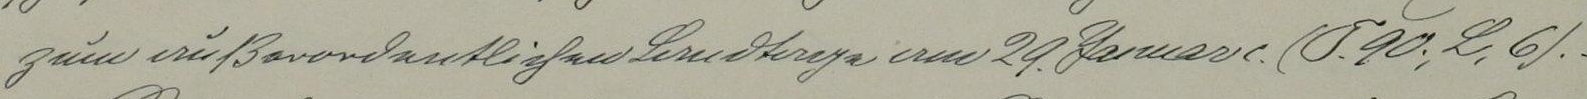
zum außerordentlichen Landtage am 29. Januar c. (T.90; L.6).
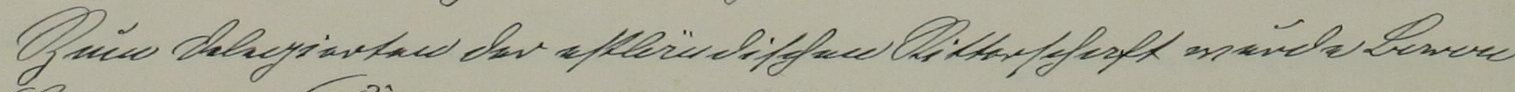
Zum Delegierten der estländischen Ritterschaft wurde Baron
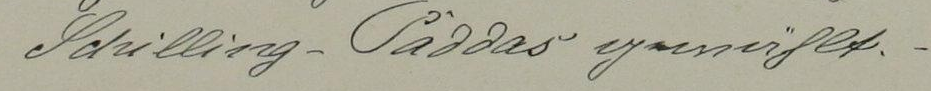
Schilling-Paddas gewählt.
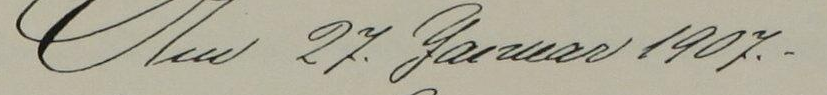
Am 27. Januar 1907.
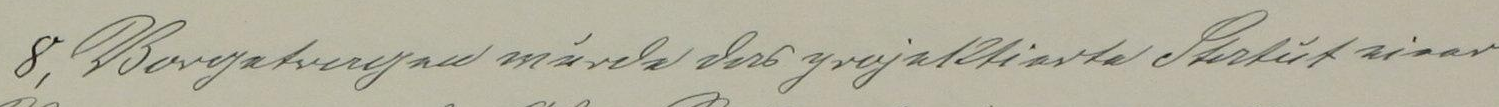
8. Vorgetragen wurde das projektierte Statut einer
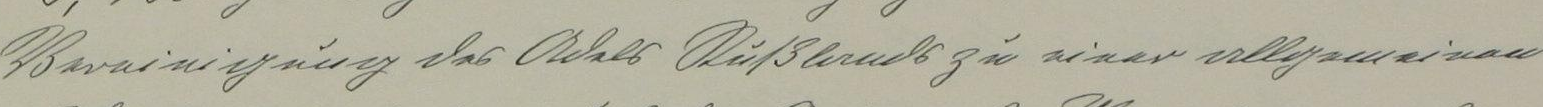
Vereinigung des Adels Rußlands zu einer allgemeinen
